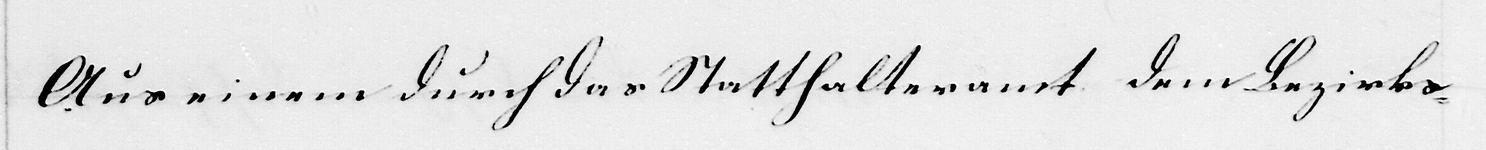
Aus einem durch das Statthalteramt dem Bezirks¬
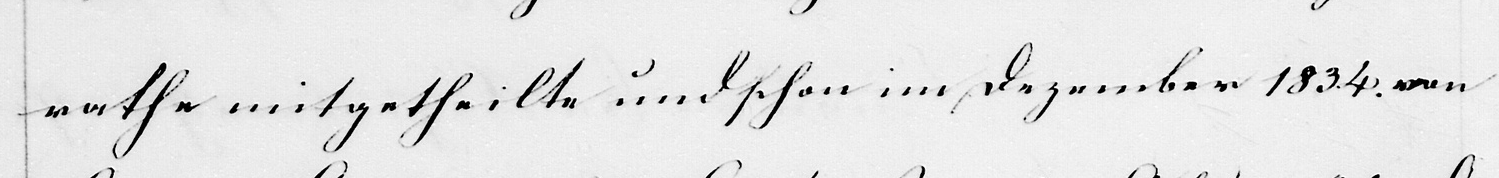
rathe mitgetheilte und schon im Dezember 1834. von
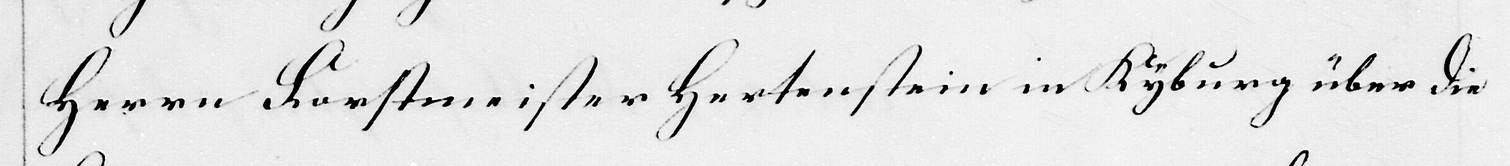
Herrn Forstmeister Hertenstein in Kyburg über die
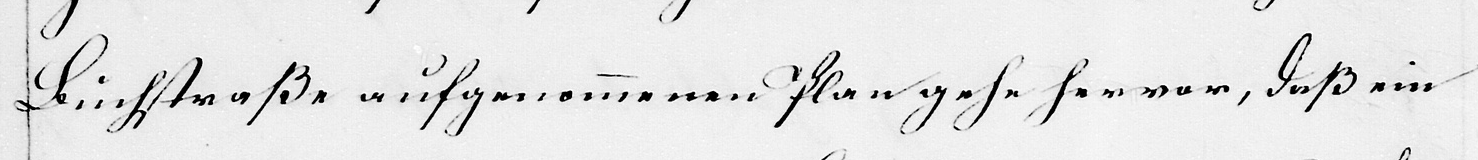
Buchstraße aufgenommenen Plan gehe hervor, daß ein
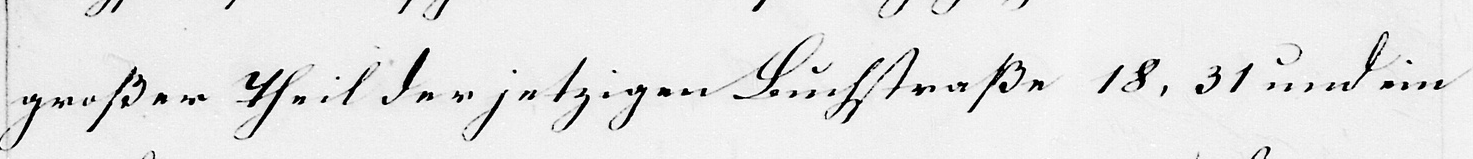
großer Theil der jetzigen Buchstraße 18,31 und ein
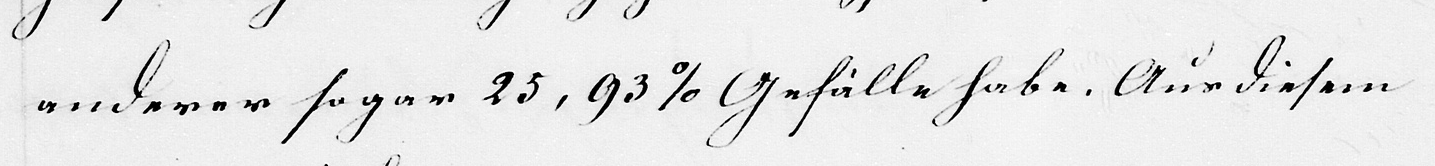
anderer sogar 25,93 % Gefälle habe. Aus diesem
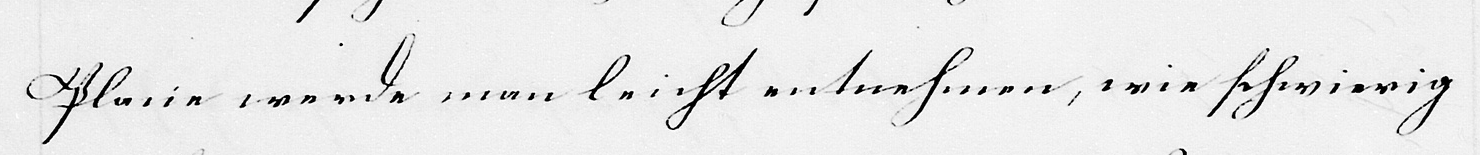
Plane werde man leicht entnehmen, wie schwierig
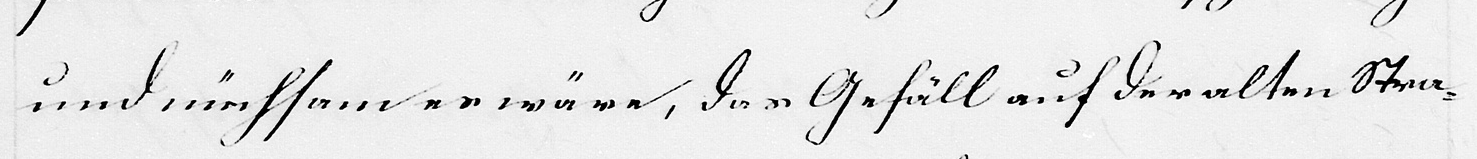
und mühsam es wäre, das Gefäll auf der alten Stra¬
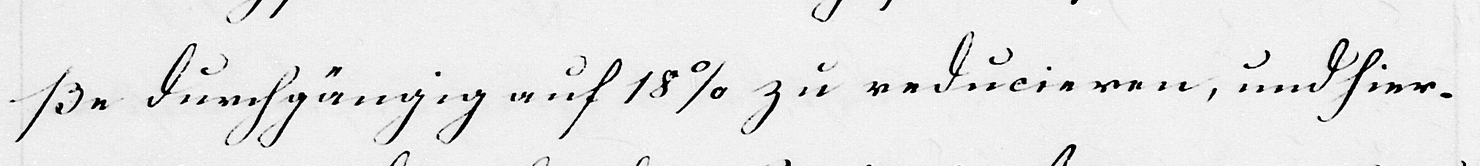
ße durchgängig auf 18 % zu reducieren, und hier¬
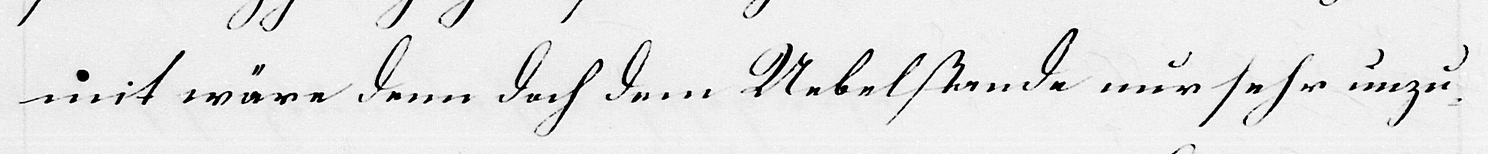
mit wäre denn doch dem Uebelstande nur sehr unzu¬
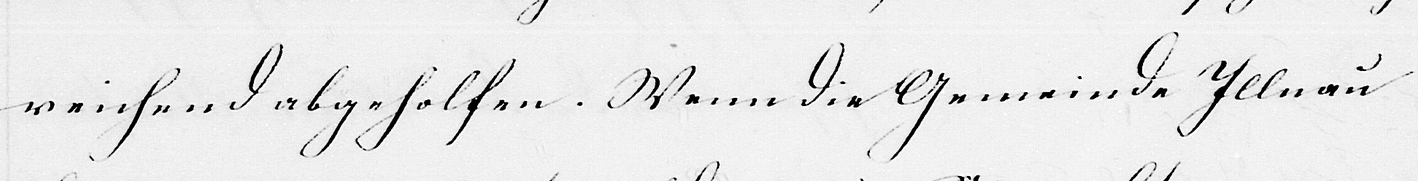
reichend abgeholfen. Wenn die Gemeinde Illnau
